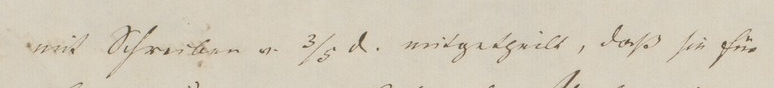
mit Schreiben v. 3/5 d. mitgetheilt, daß sie für
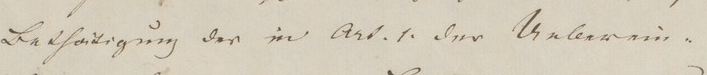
Bethätigung der in Art. 1. der Ueberein-
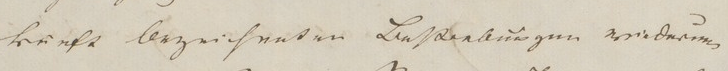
kunft bezeichneten Bestrebungen wiederum
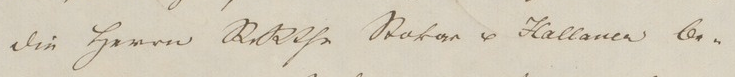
die Herrn RRthe Stokar & Hallauer be-
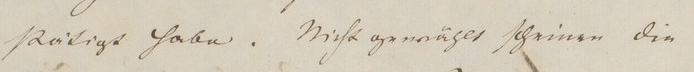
stätigt habe. Nicht gewählt scheinen die
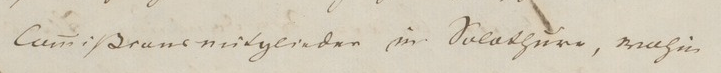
Commißionsmitglieder in Solothurn, wohin
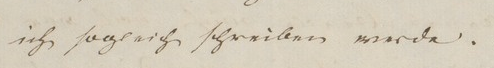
ich sogleich schreiben werde. –
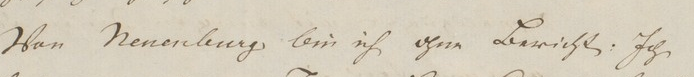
Von Neuenburg bin ich ohne Bericht: Ich
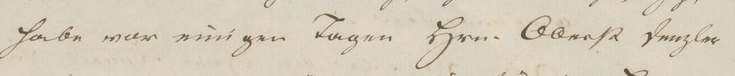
habe vor einigen Tagen Hrn. Oberst Denzler
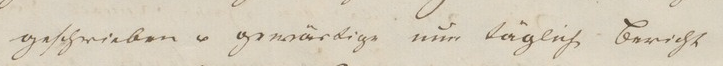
geschrieben & gewärtige nun täglich Bericht
